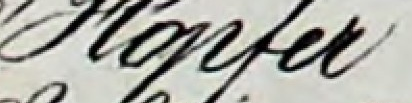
Hopfer
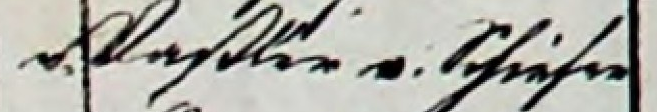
v. Vastker v. Schiefer
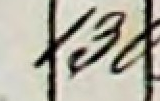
130
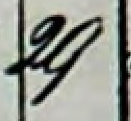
29
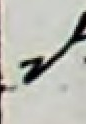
Do
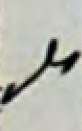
Do
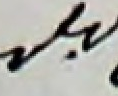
Do
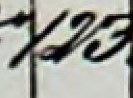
123
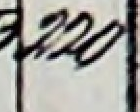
220
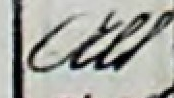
Alt
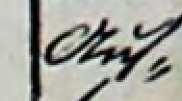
Aus„
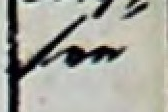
see
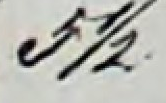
5 1/2
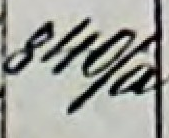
840/a
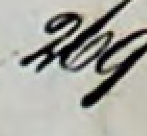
269
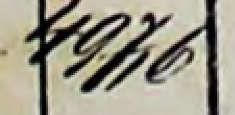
497,6
